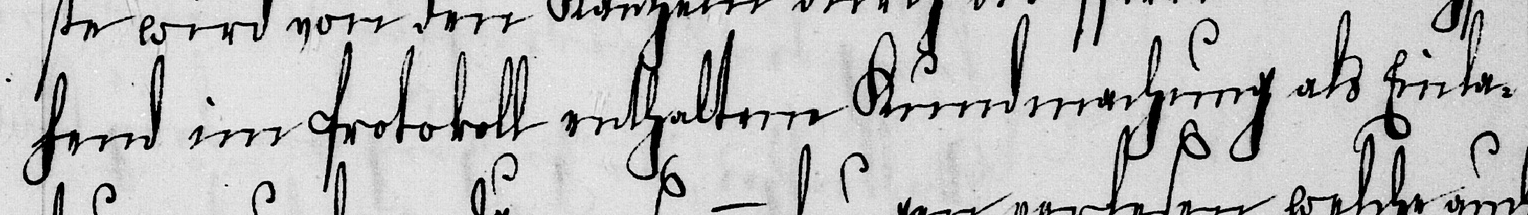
hend im Protokoll enthaltene Kundmachung als Einla¬
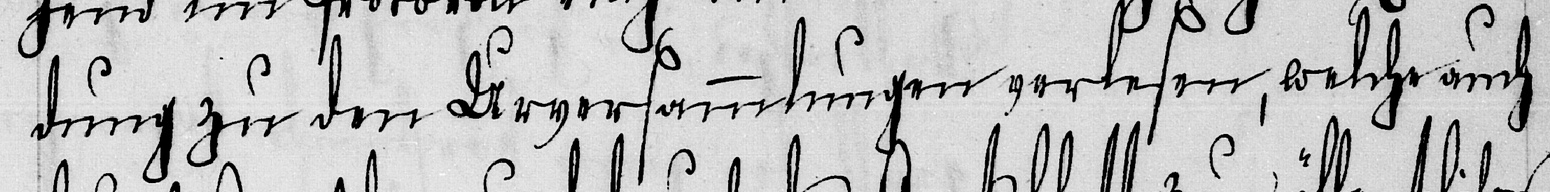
dung zu den Urversammlungen verlesen, welche auch
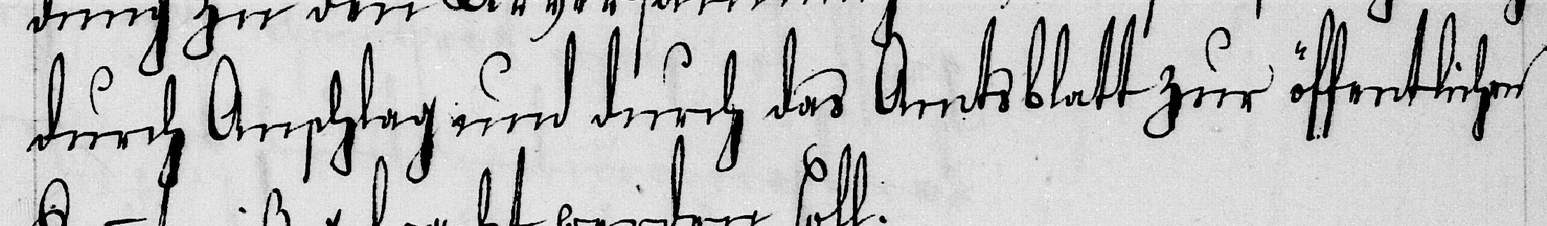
durch Anschlag und durch das Amtsblatt zur öffentlic¬
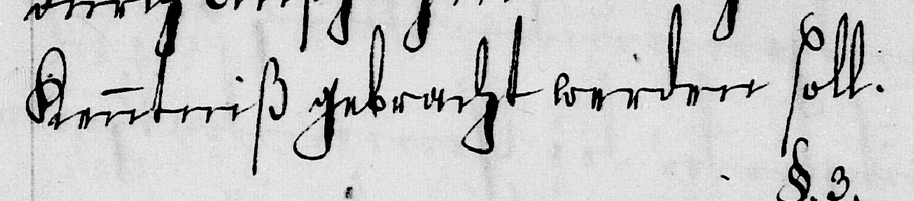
Kenntniß gebracht werden soll.
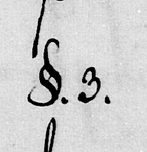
§. 3.
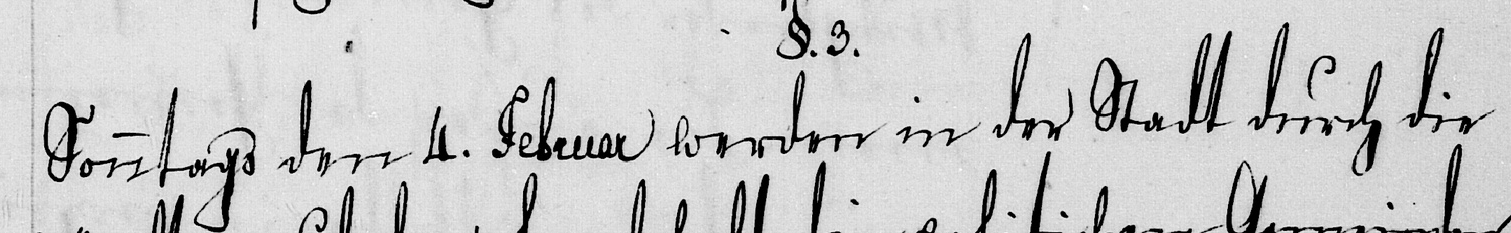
Sonntags den 4. Februar werden in der Stadt durch die
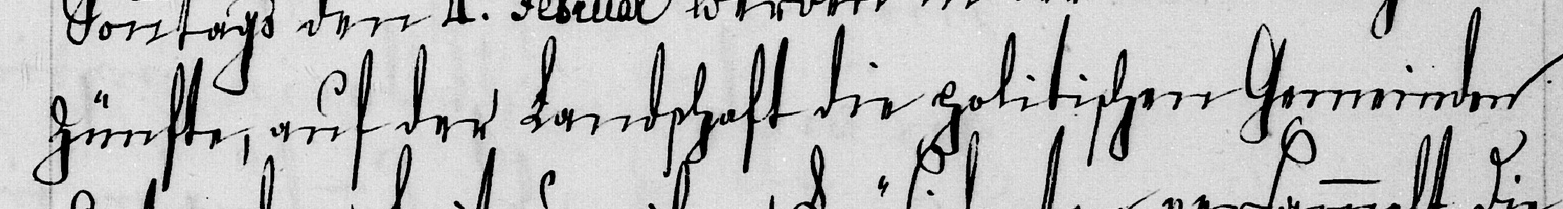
Zünfte, auf der Landschaft die politischen Gemeinden
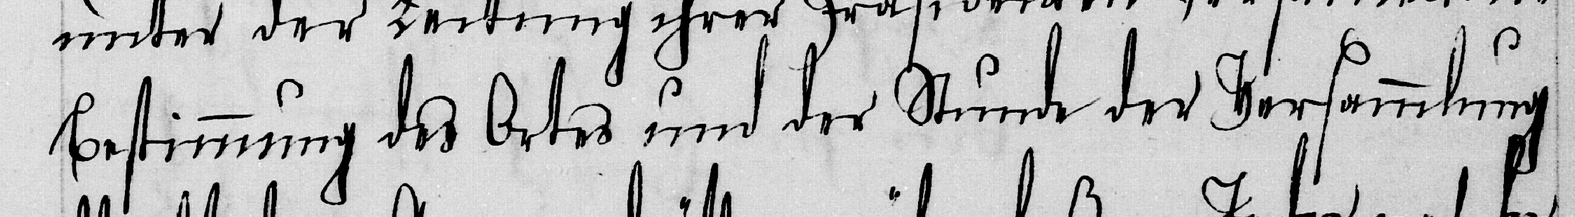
Bestimmung des Ortes und der Stunde der Versammlung
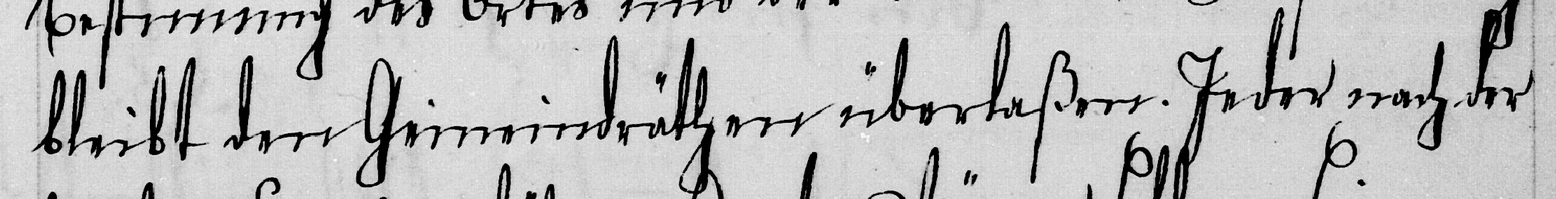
bleibt den Gemeindräthen überlaßen. Jeder nach der
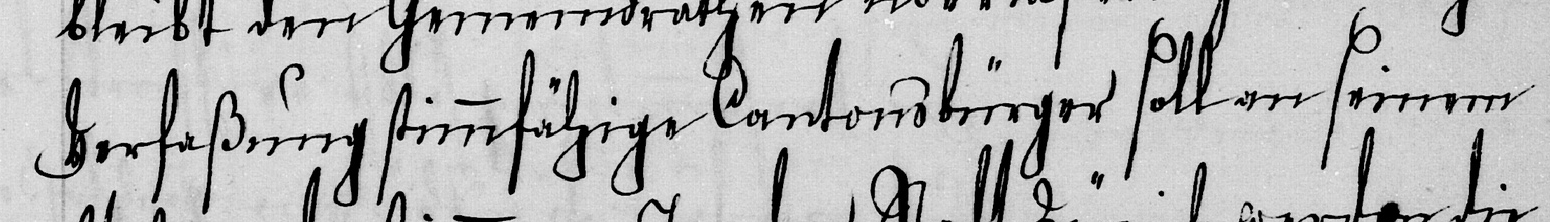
Verfaßung stimmfähige Cantonsbürger soll an seinem
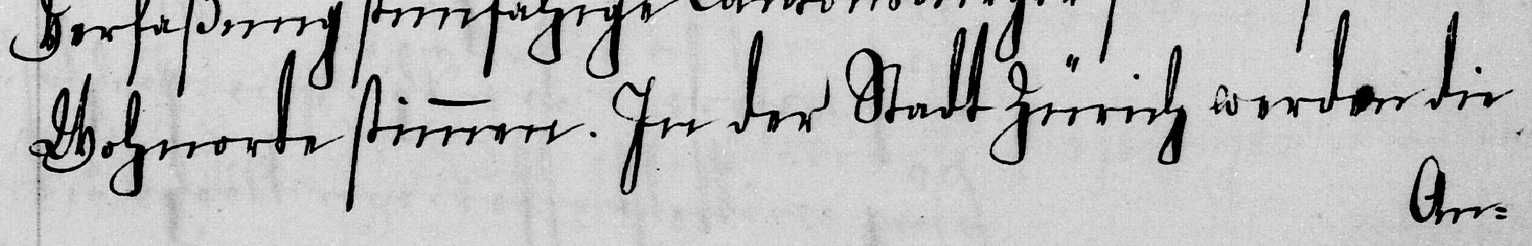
Wohnorte stimmen. In der Stadt Zürich werden die
